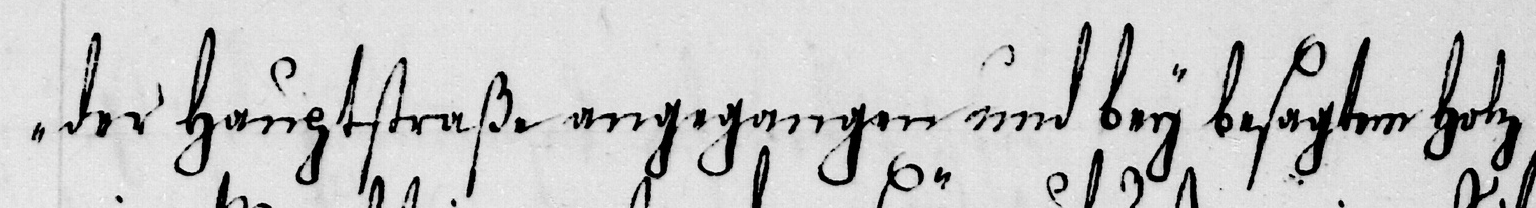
der Hauptstraße angegangen und bey besagtem Holz
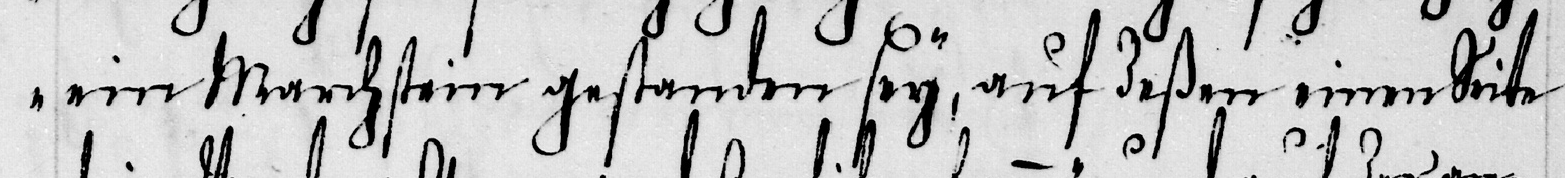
ein Marchstein gestanden sey, auf deßen einen Seite
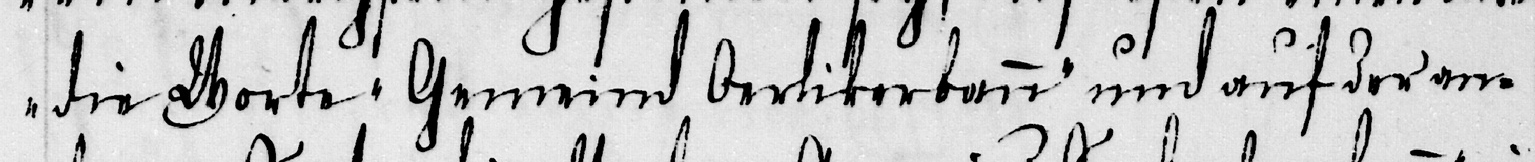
die Worte „Gemeind Oerlikerbann“ und auf der an¬
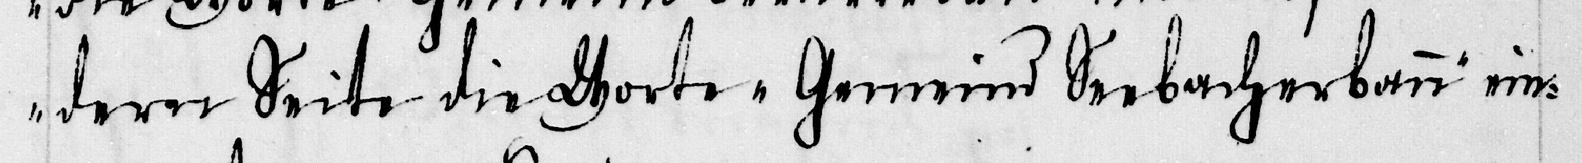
dern Seite die Worte „Gemeind Seebacherbann“ ein¬
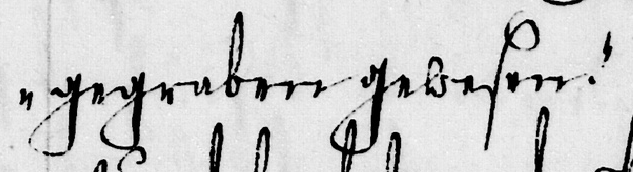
gegraben gewesen.“
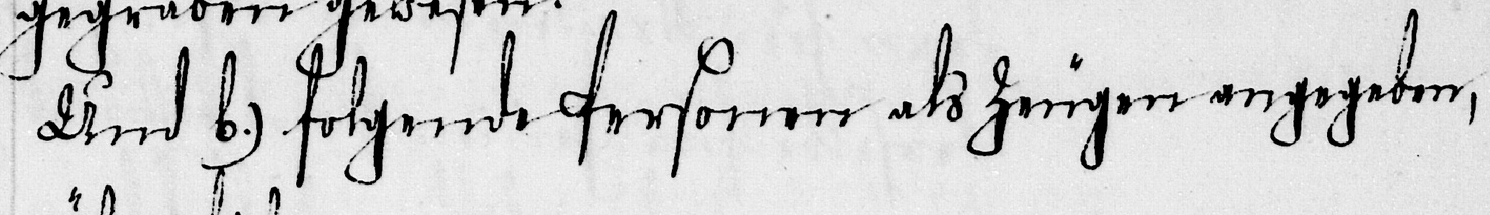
Und b.) folgende Personen als Zeugen angegeben,
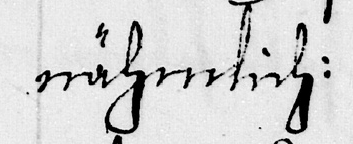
nähmlich:
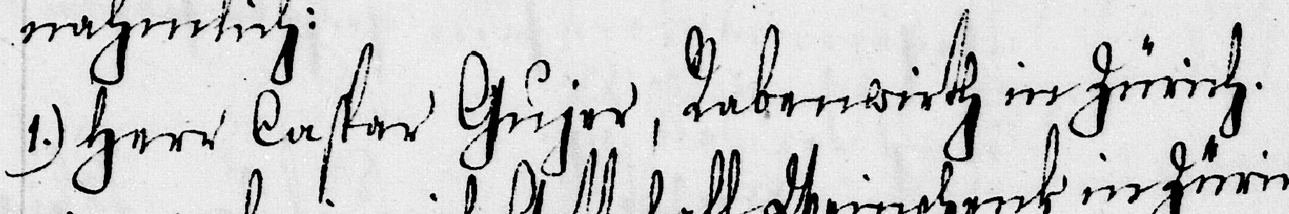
1.) Herr Caspar Gujer, Rabenwirth in Zürich.
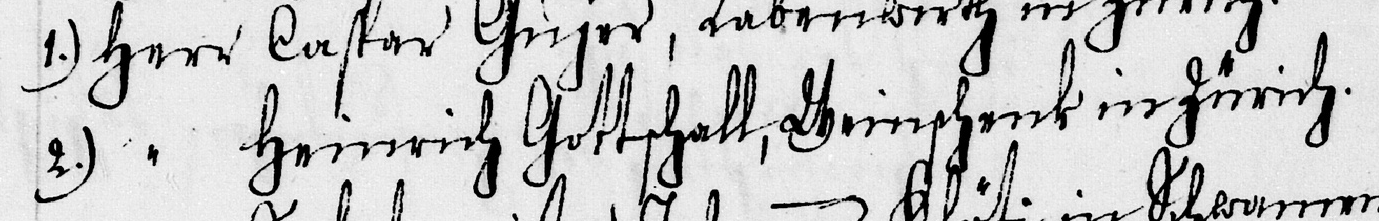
2.) “ Heinrich Gottschall, Weinschenk in Zürich.
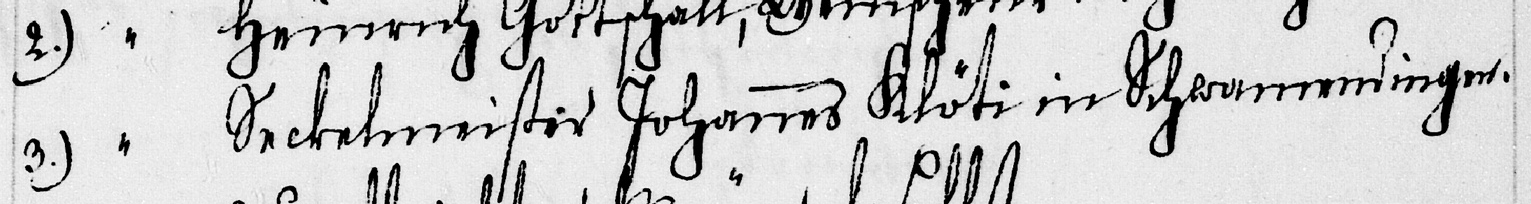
3.) “ Seckelmeister Johannes Klöti in Schwamendingen.
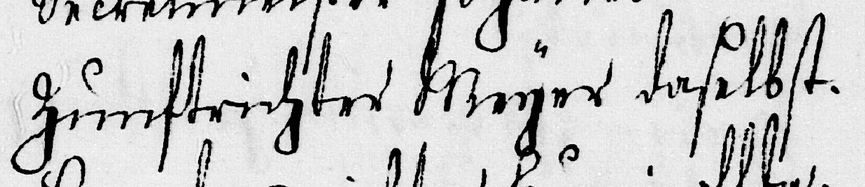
Zunftrichter Meyer daselbst.
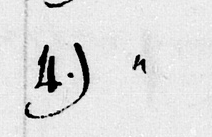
5.)
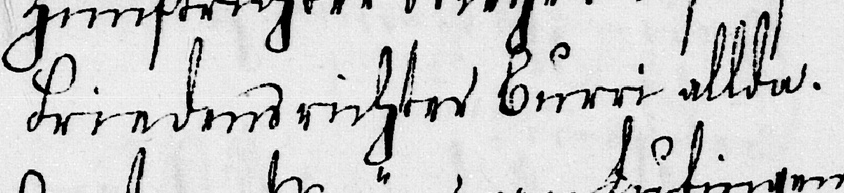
Friedensrichter Burri allda.
